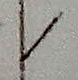1
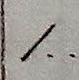1.
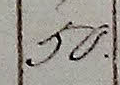50.
